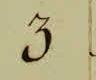3
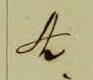4
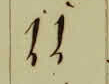11
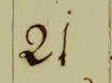21
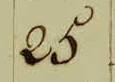25
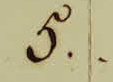5.
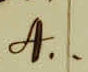4.
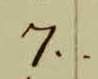7.
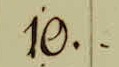10.
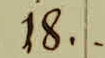18.
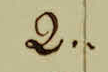2.
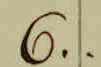6.
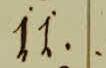11.
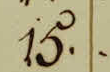15.
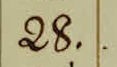28.
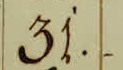31.
